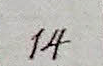14
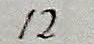12
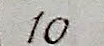10
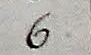6
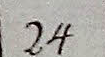24
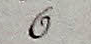6
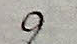9
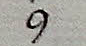9
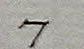7
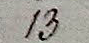13
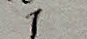1
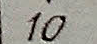10
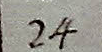24
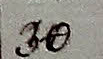30
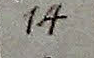14
